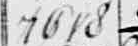7618
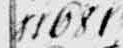11681
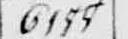6155
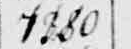7380
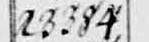23384
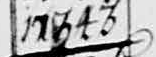17543
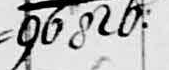96826
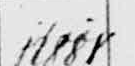12881
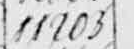11203
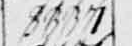3337
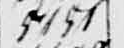5151
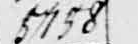5758
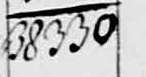38330
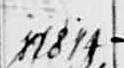12814
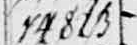14823
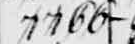7366
